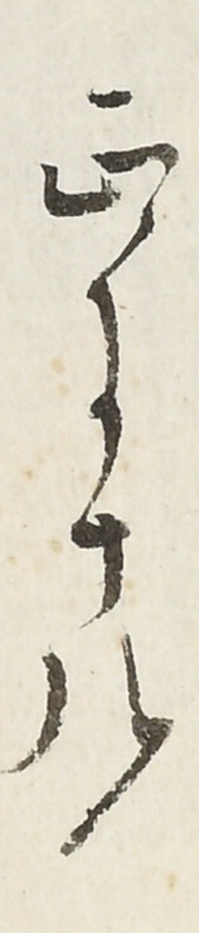正月十八日
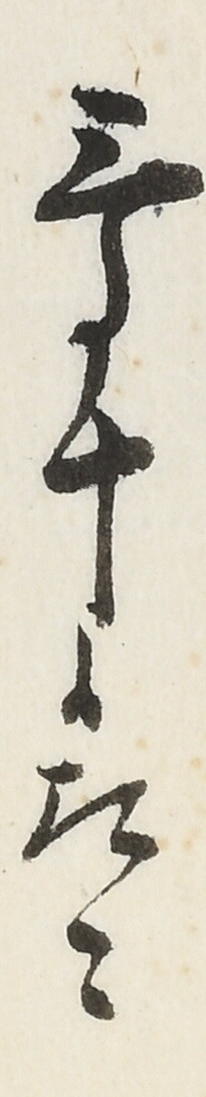三月十日左ニ
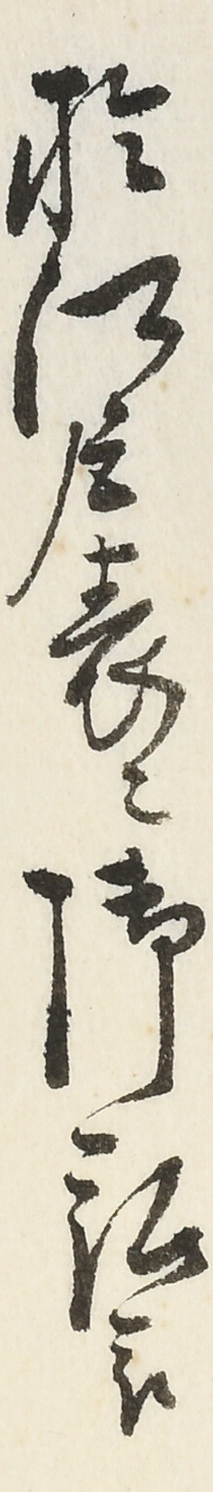於江戸表ニ御弘被
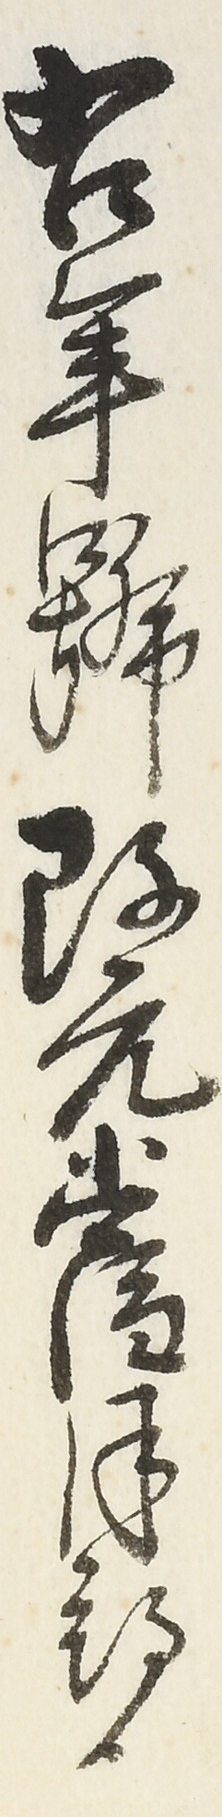右年号改元当月朔日
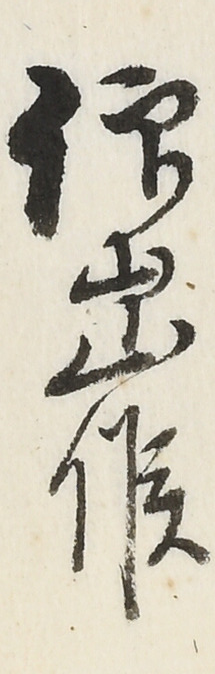仰出候
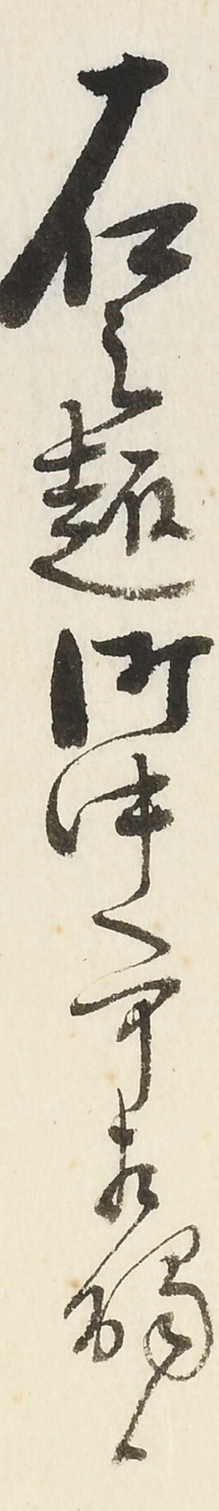右之趣町中へ可相触候
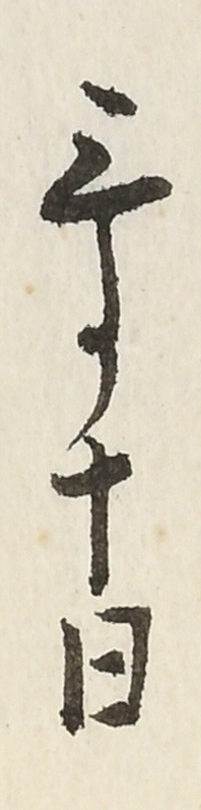三月十日
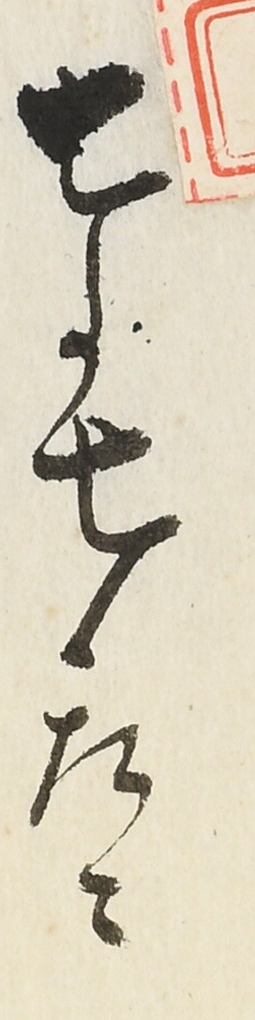七月七日左ニ
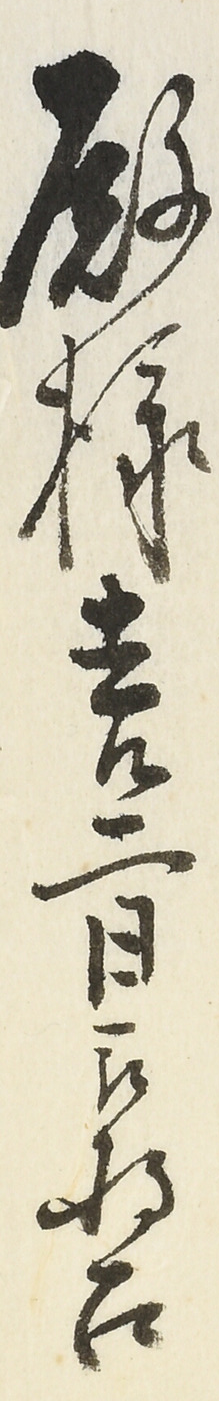殿様去ル二日被為召
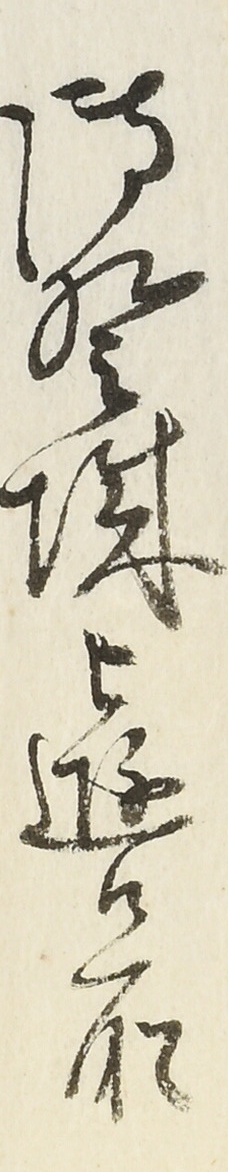御登城被遊候所
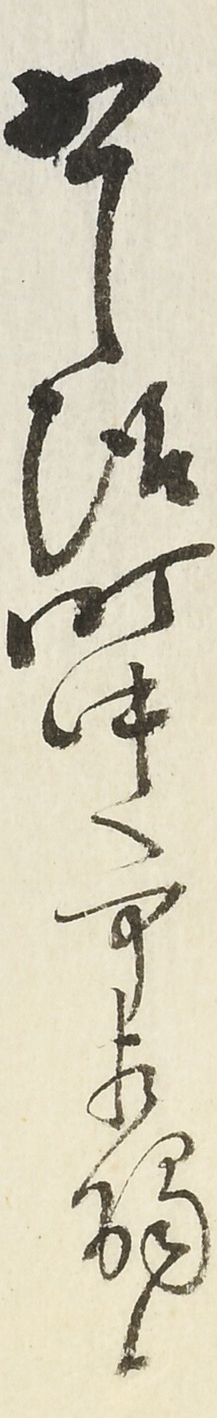右之趣町中へ可相触候

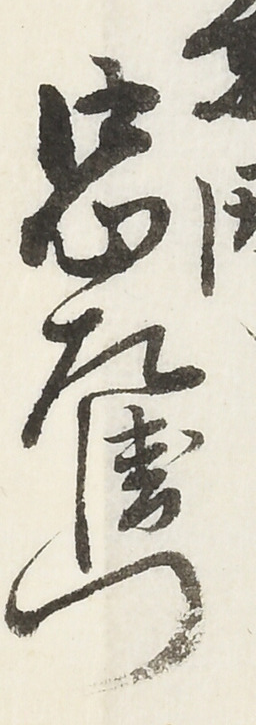忠左衛門
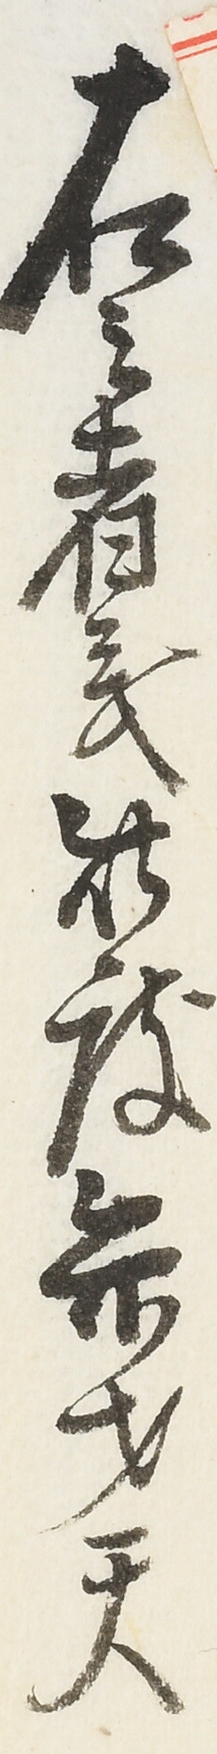右之者義此度弁才天
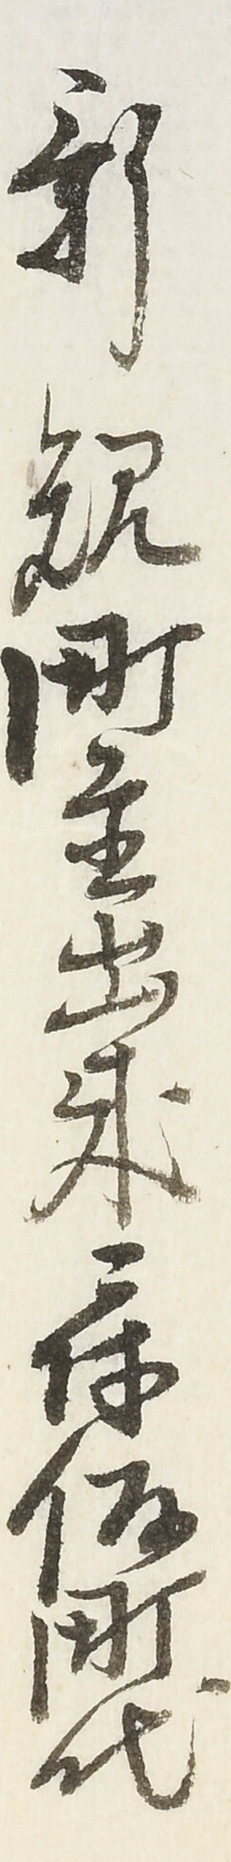新規町並出来ニ付仮町代
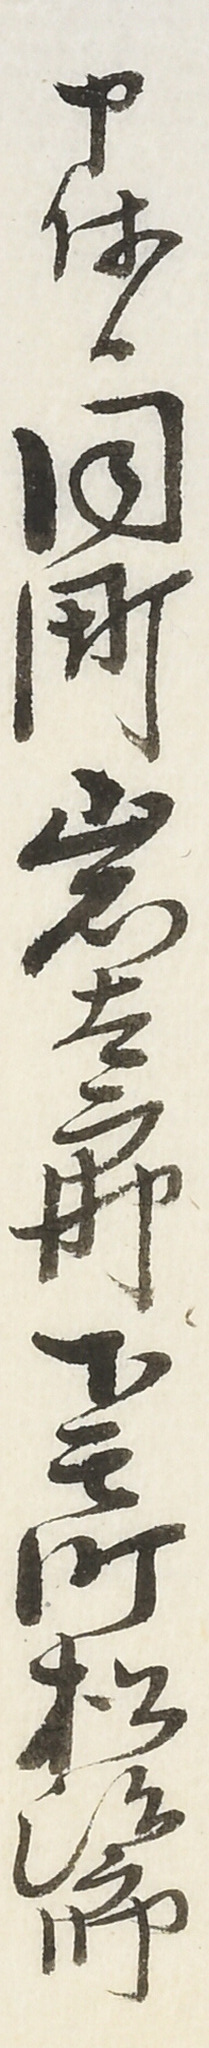申付候同町岩太郎下モ町松治郎
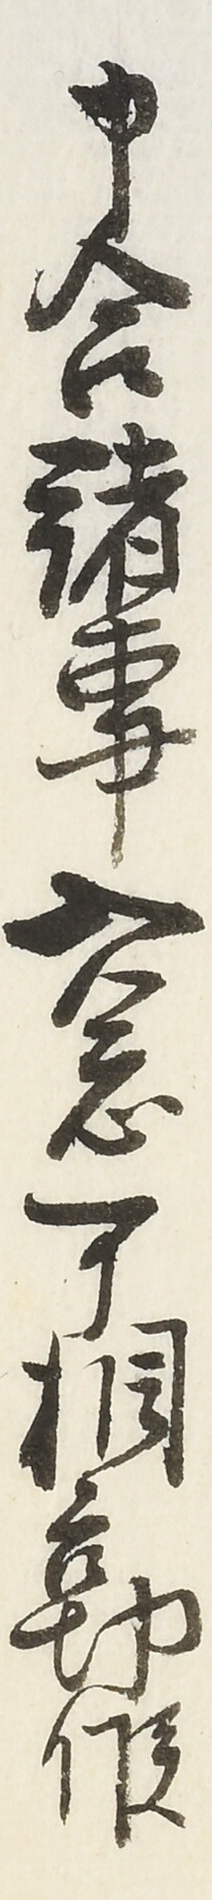申合諸事入念可相勤候
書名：御触書留
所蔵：伊那市立高遠町図書館・合同会社AMANE
